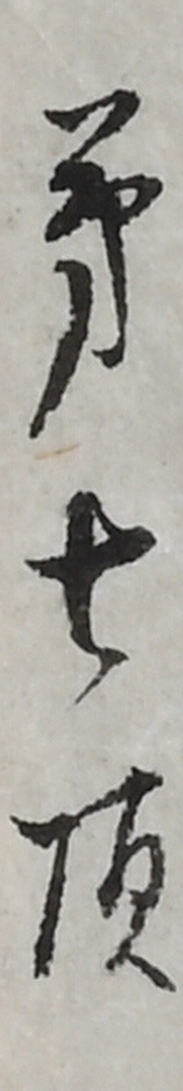第七項
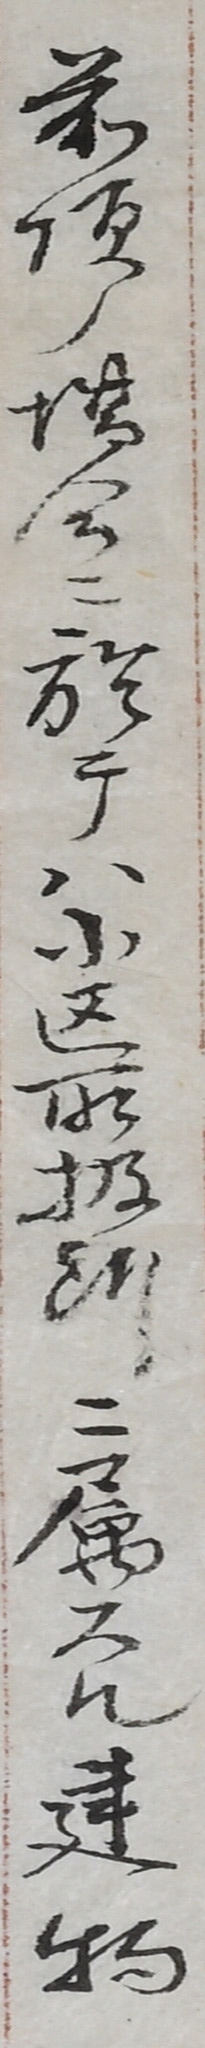前項ノ場合ニ於テハ小区取扱所二属スル建物
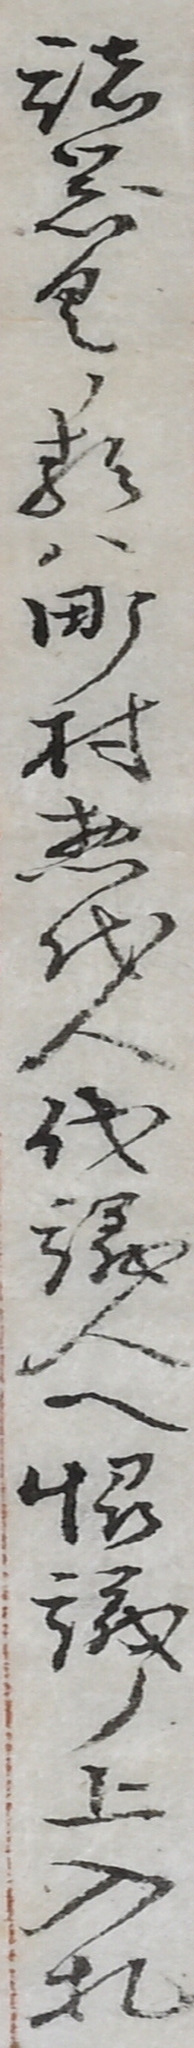諸器具ノ類ハ町村惣代人代議人へ協議ノ上入札
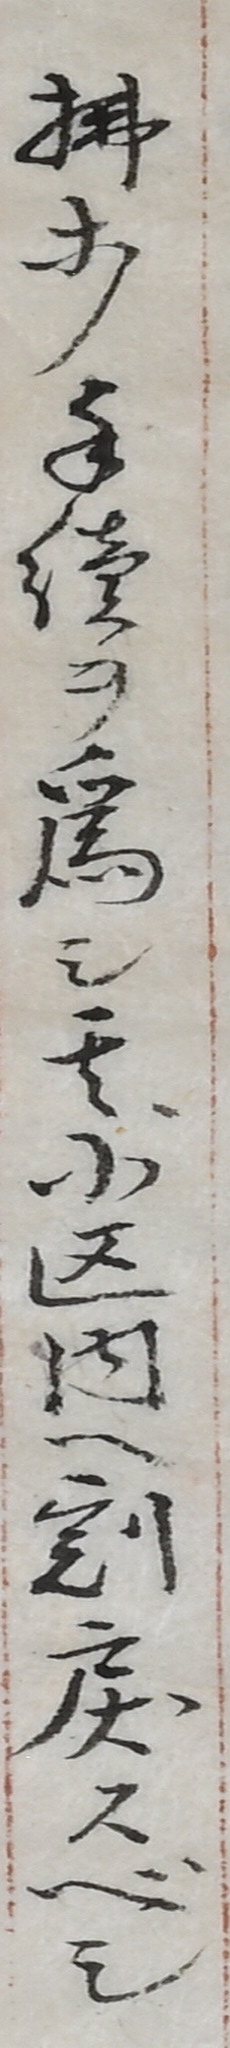払等ノ手続ヲ為シ其小区内ヘ割戻スベシ
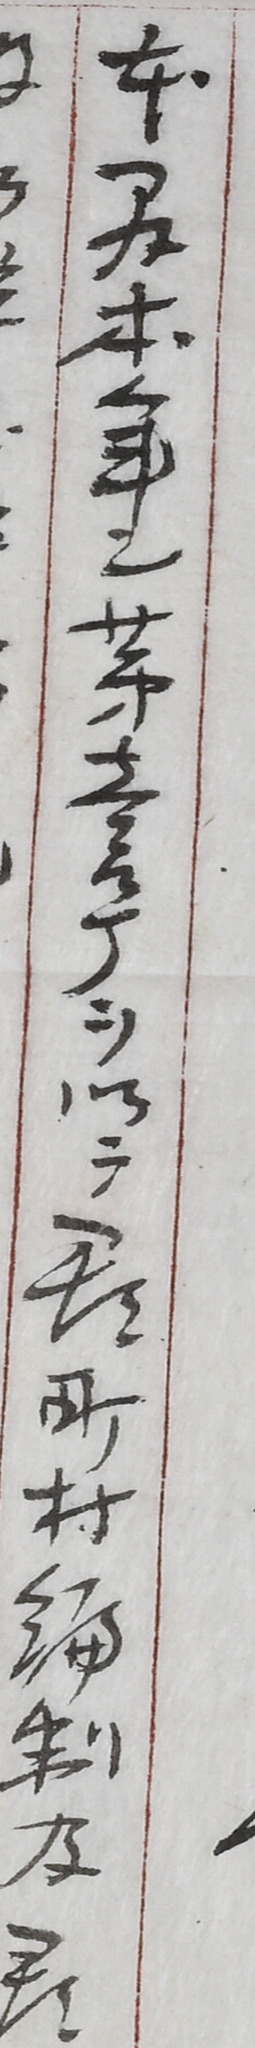本県本年ン第壱号ヲ以テ郡町村編制及郡
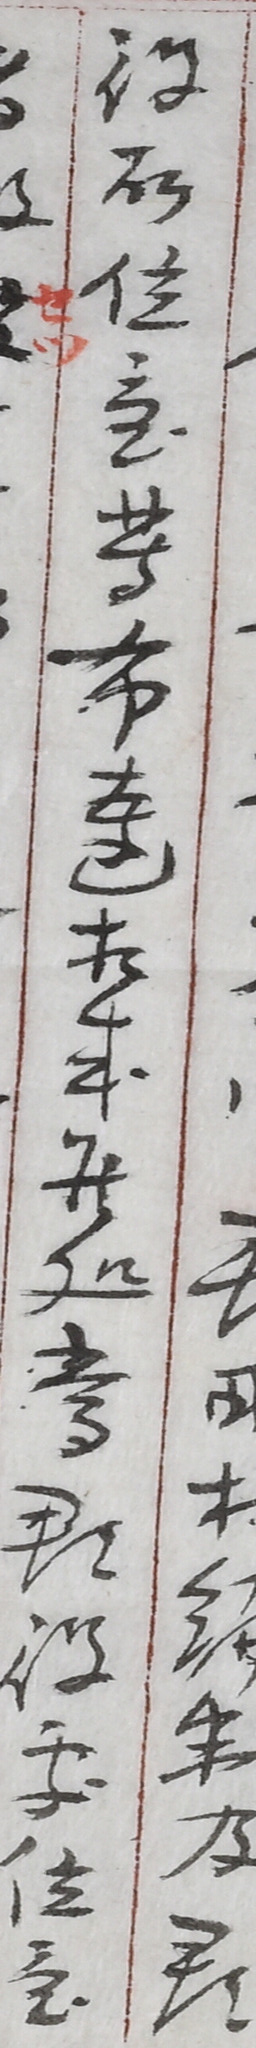役所位置等布達相成候処当郡役所位置
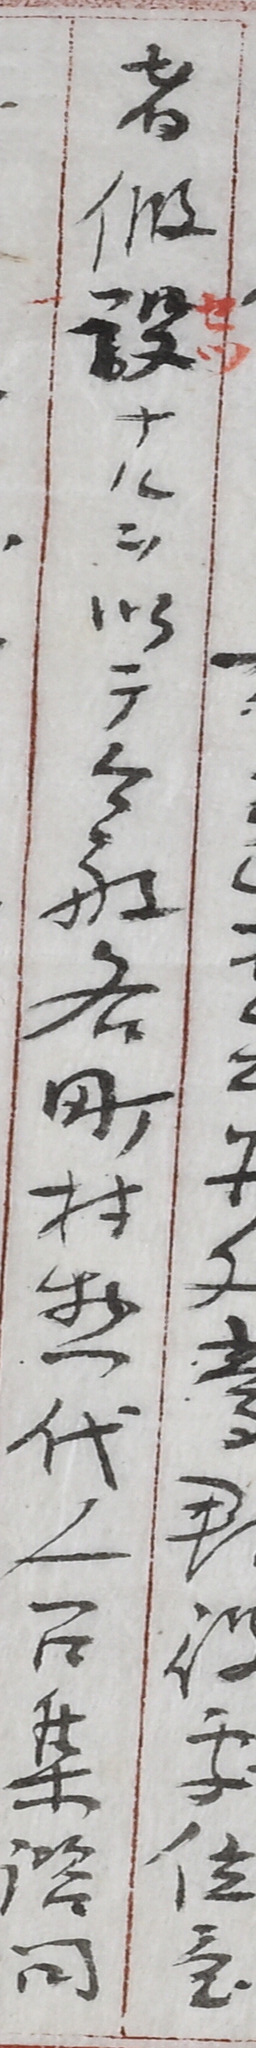者仮設ナルヲ以テ今般各町村惣代人召集諮問
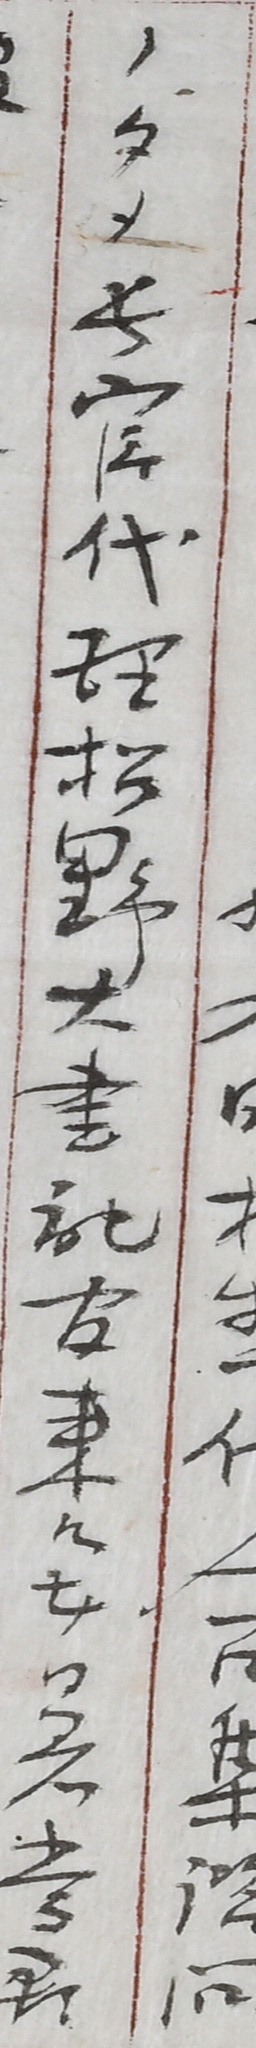ノタメ其官代理松野大書記官来ル廿日着当郡
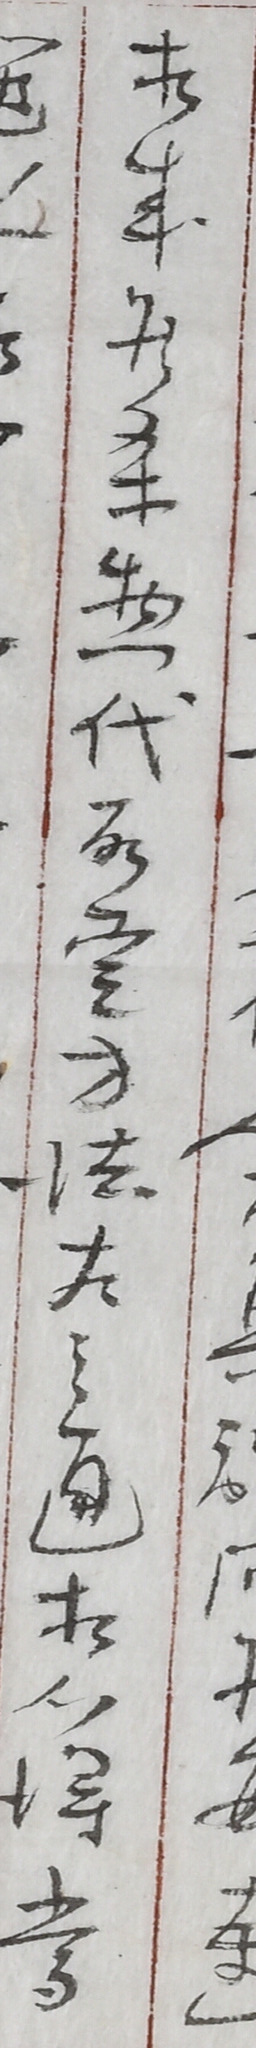相成廿候条惣代取定方法左之通相心得当
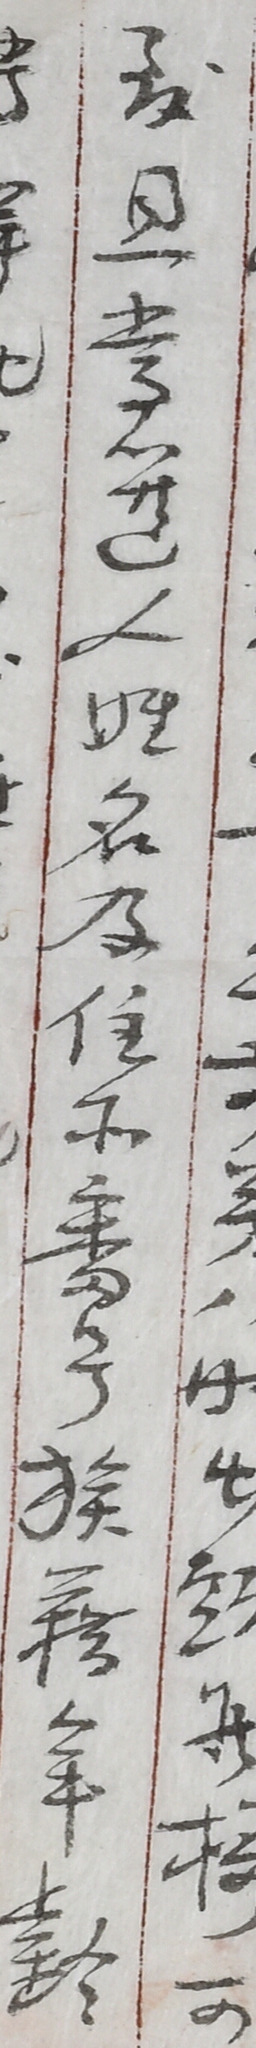致且當選人姓名及住所番号族籍年齢
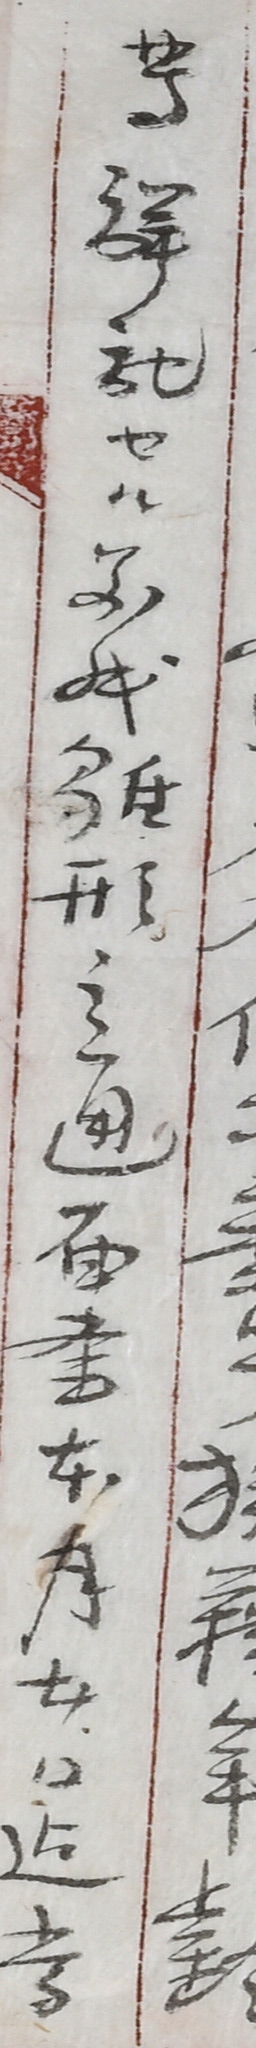等詳記セル別紙雛形之通届書本月廿日迄当

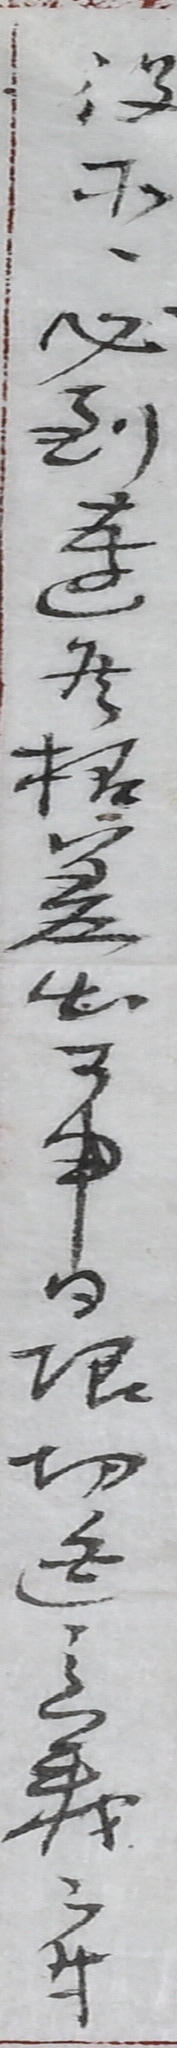役所へ必到達候様差出可申日限切迫之義ニ付
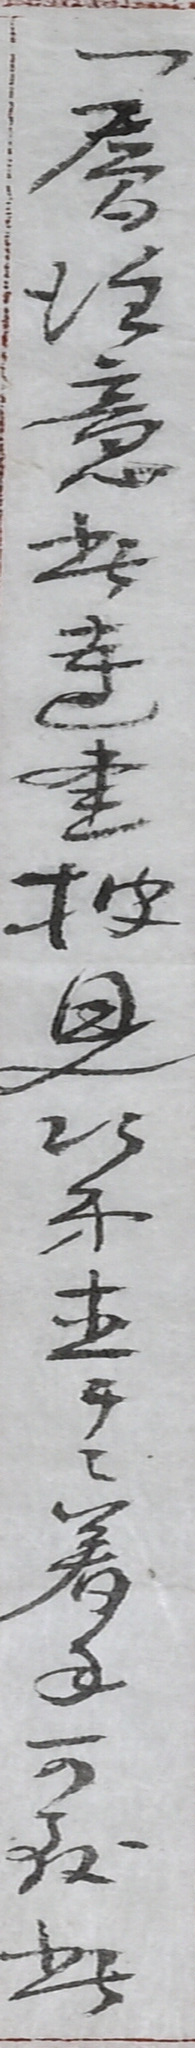一層注意此達書披見次第直チニ着手可致此
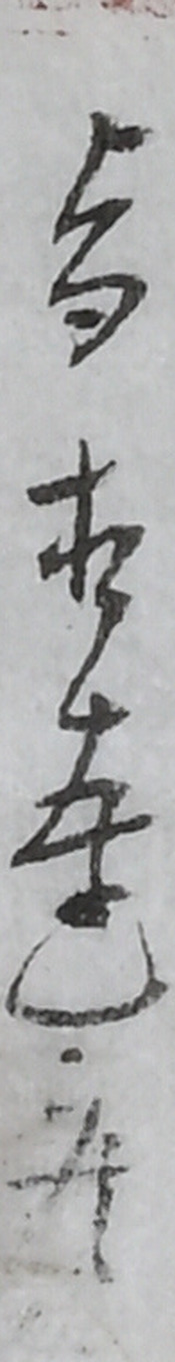旨相達候
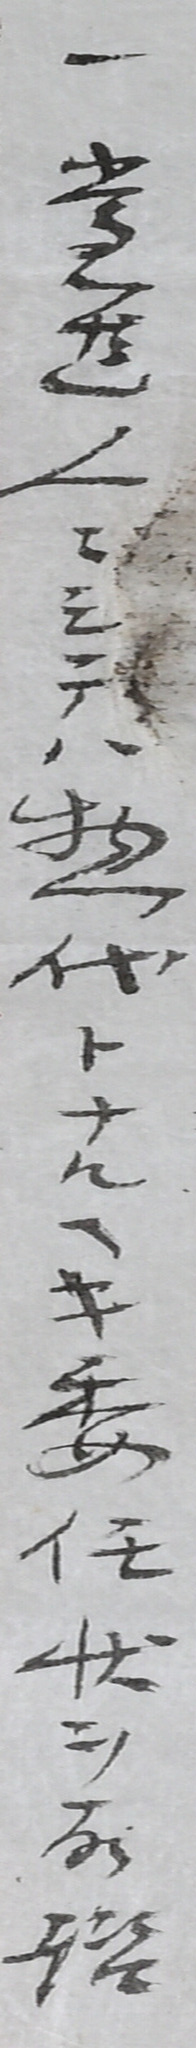一当迄選人ニシテハ惣代トナルヘキ委任状ヲ取諮
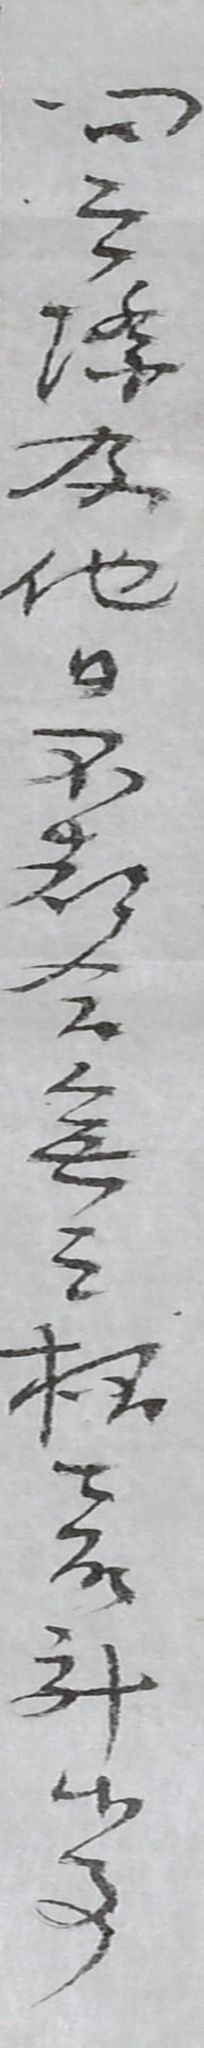問之際及他日不都合無之様可取計候事
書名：郡役所勤務中御用抜書
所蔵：伊那市立高遠町図書館・合同会社AMANE
